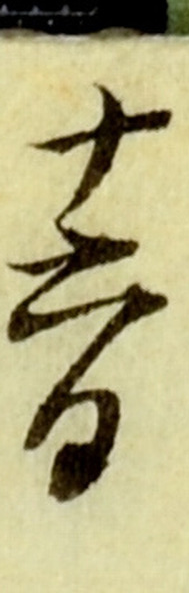十六日
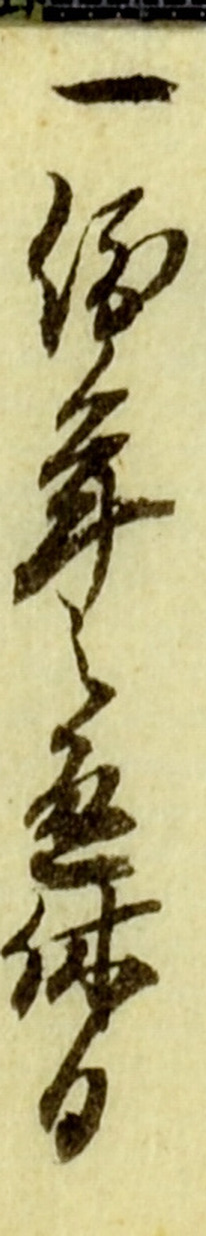一例年之通休日
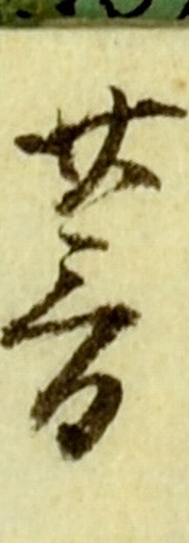廿三日
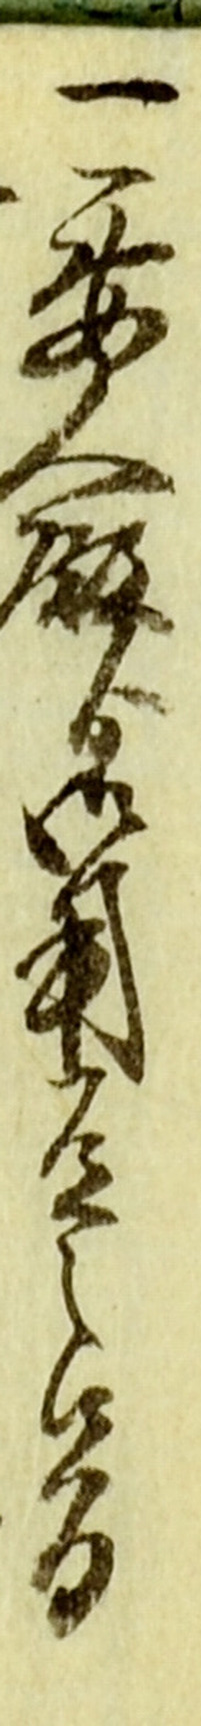一要人様ゟ御用有之候間
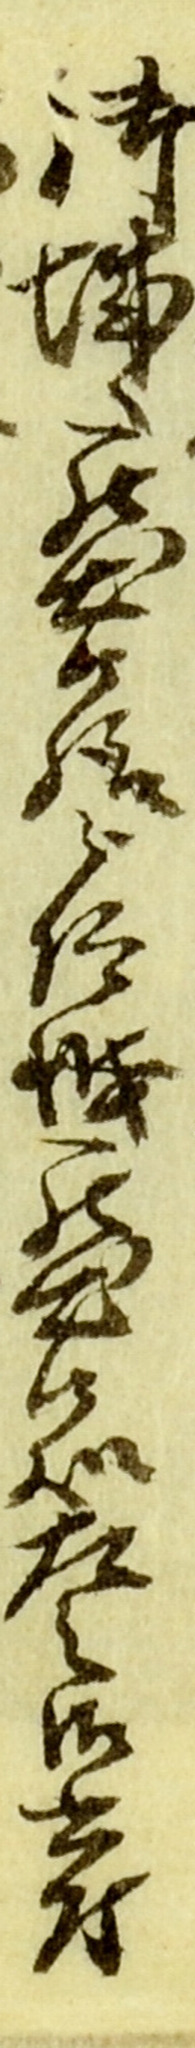御城へ罷出候様被仰越罷出候処左之御書付
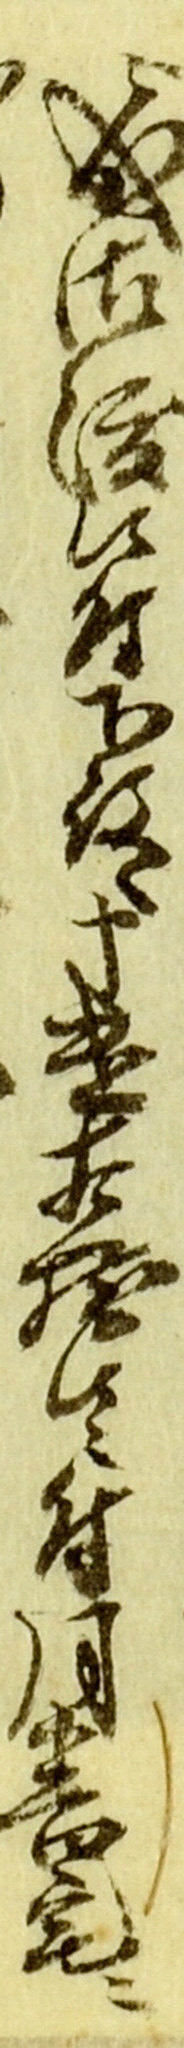被成御渡候付下役へ申遣相揃候ニ付月番宅ニ
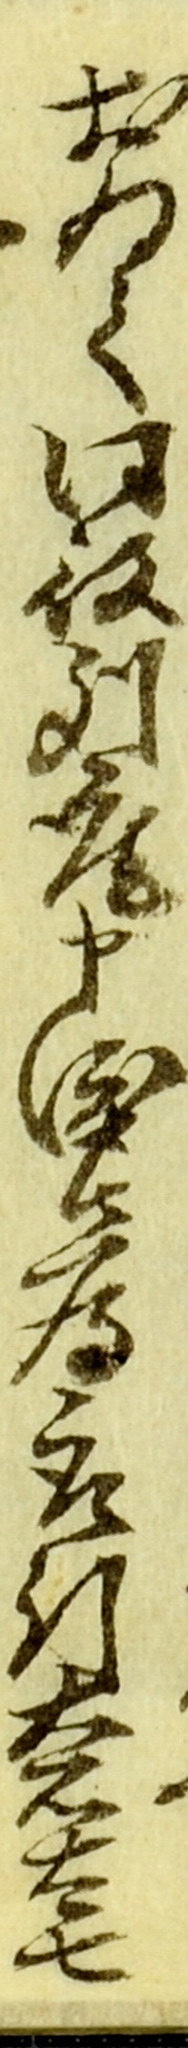おゐて同役列座申渡候為取引大石太七
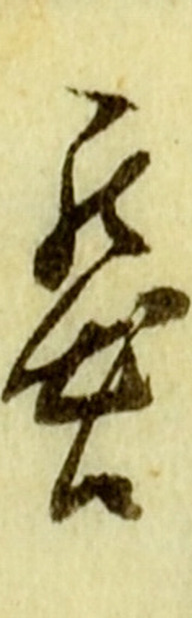罷出候
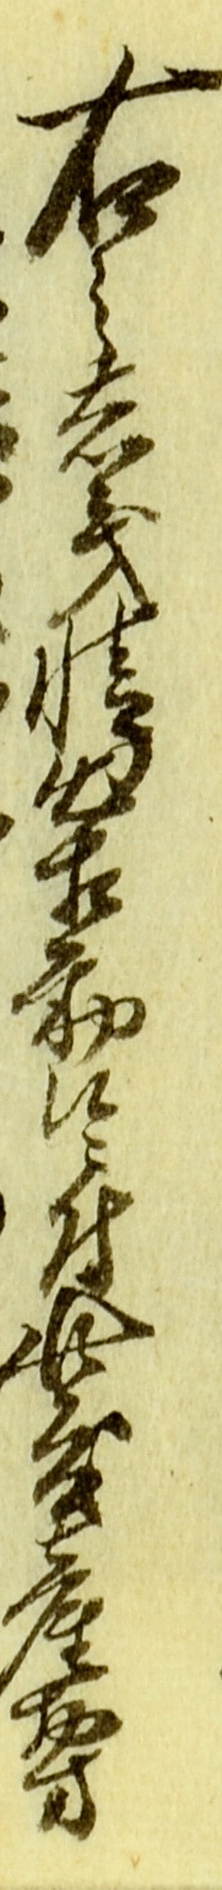右之者義情出相勤候ニ付此度産物方
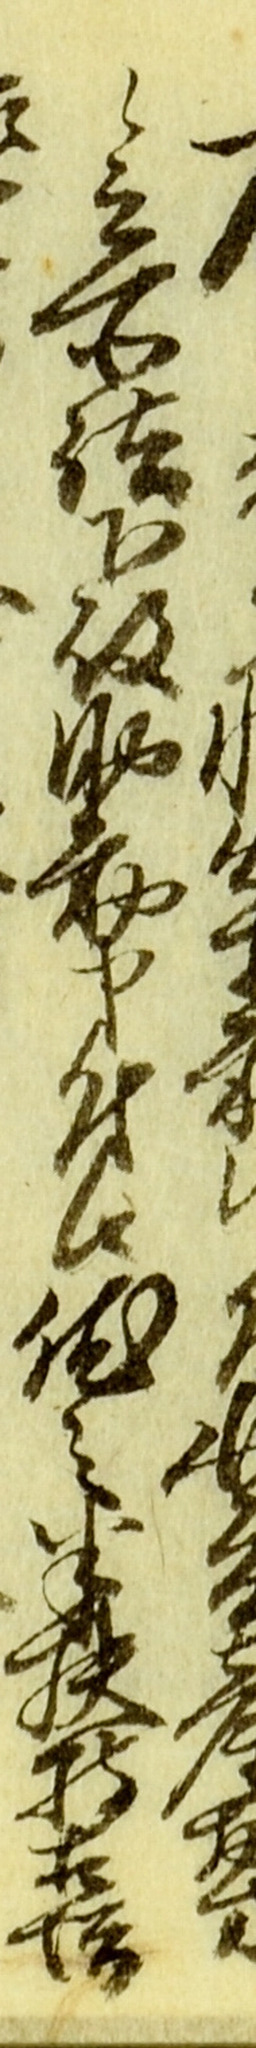之会所詰下役助始申付候然ニ半扶持相増
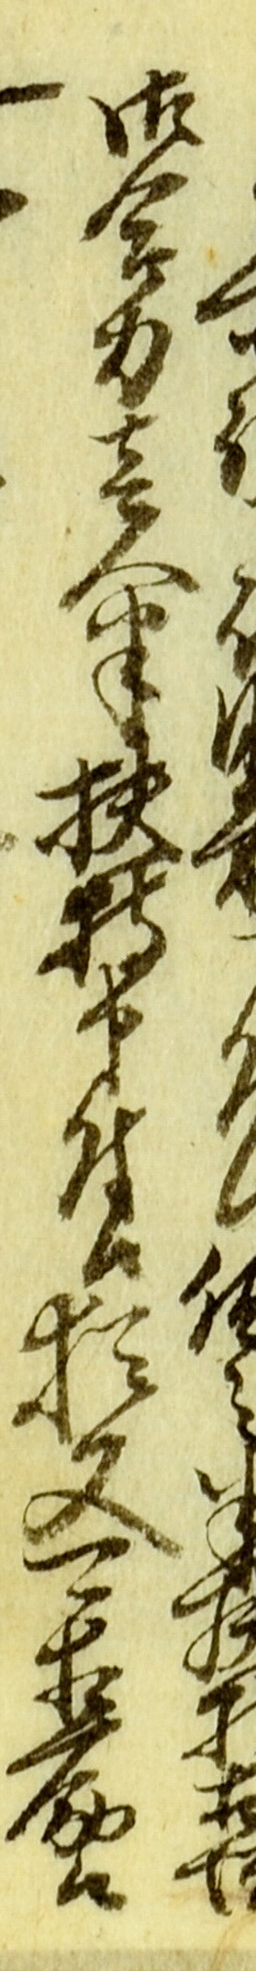御合力壱人半扶持申付候猶又可相励候
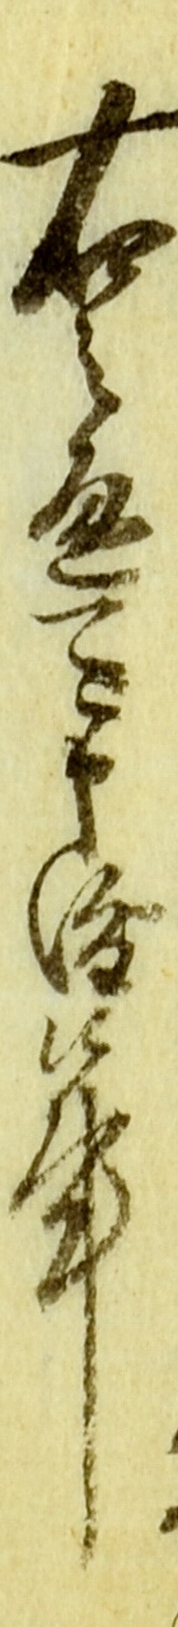右之通可申渡候事
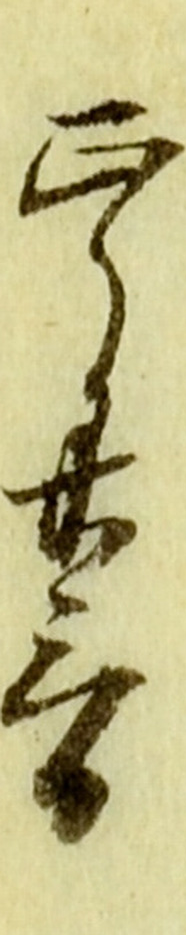正月廿三日
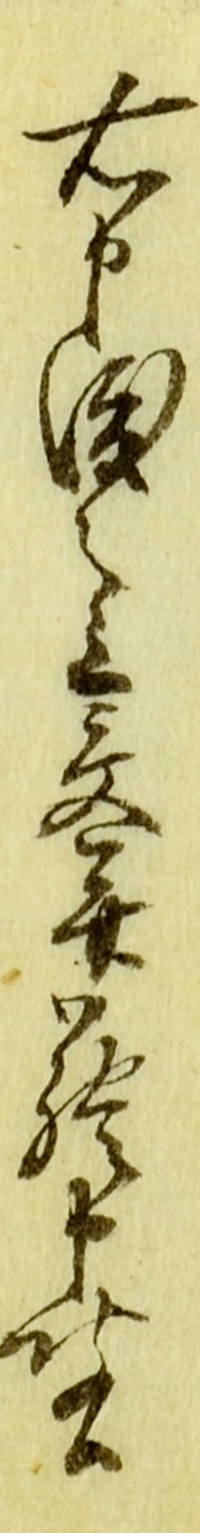右申渡之上受幷御礼申付候
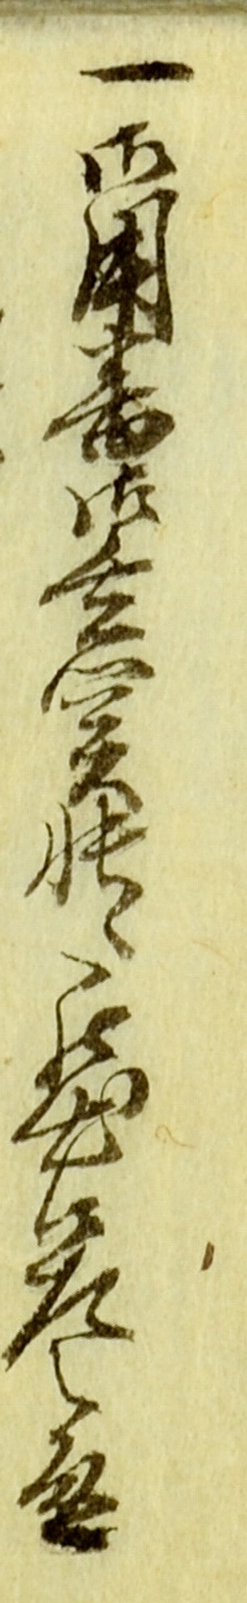一御用番御玄関帳へ罷出候左之通
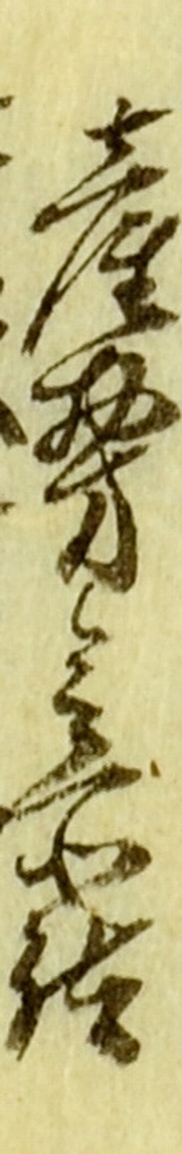産物方之会所詰
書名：諸事御用留
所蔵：伊那市立高遠町図書館・合同会社AMANE
